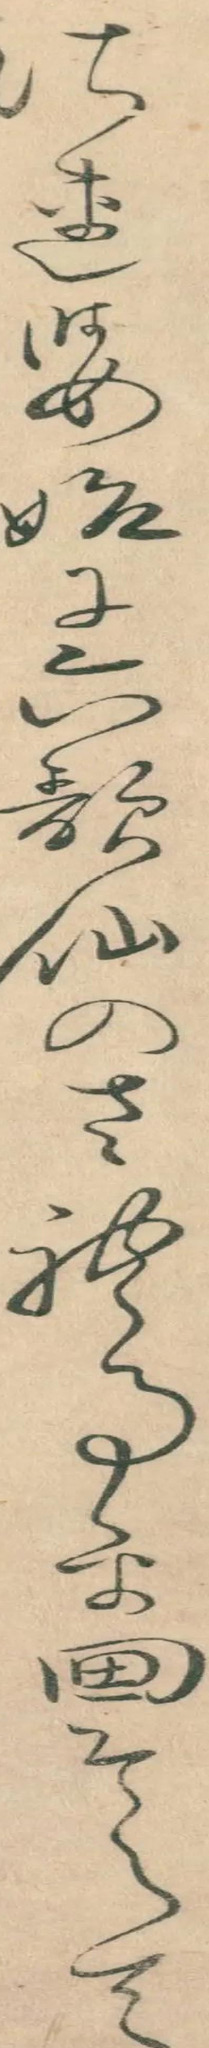されば始に六歌仙のさゝれ事をそえて
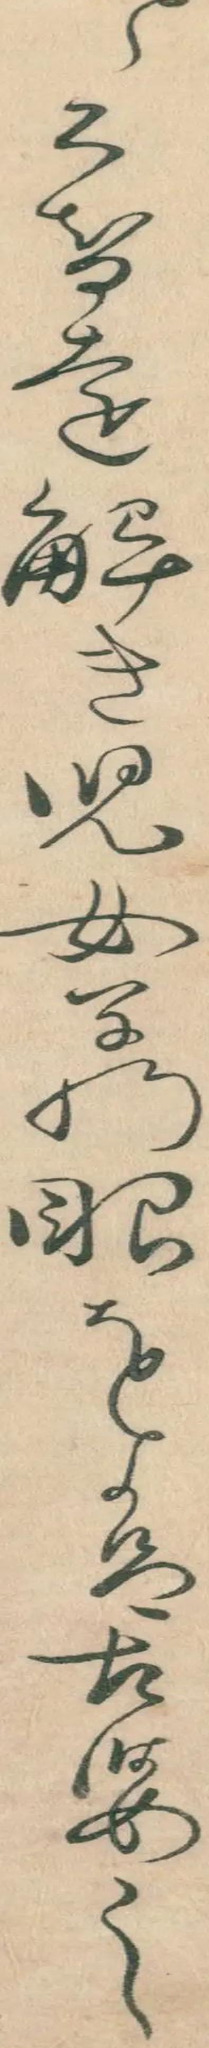いとくちを解き児女子の眼をよろこばし
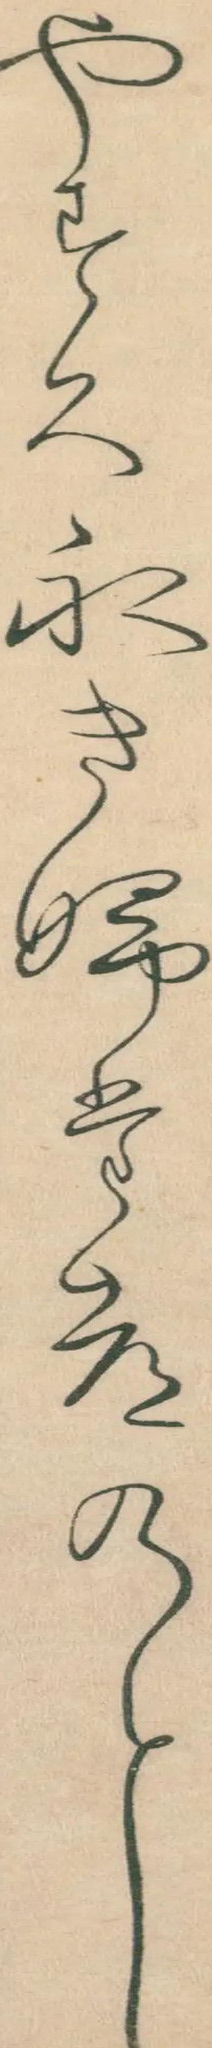やすく永ききたつのとし
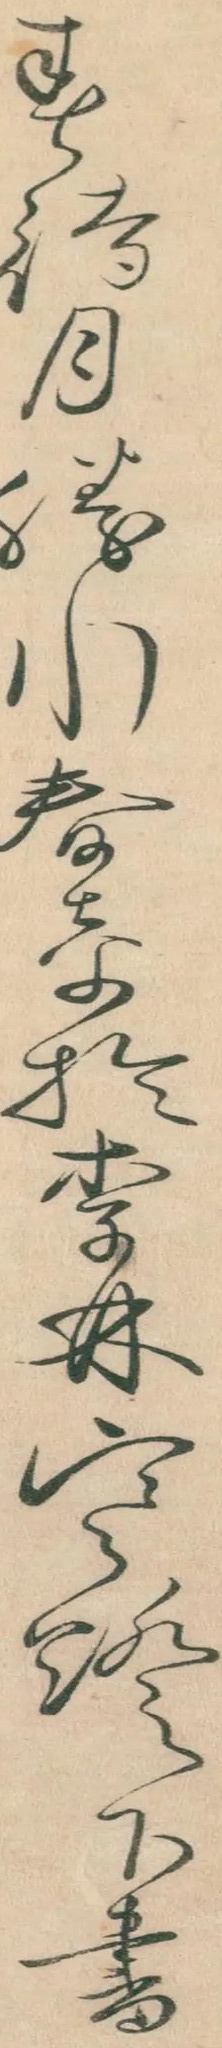春待月勝川春なお李林寒路之下書
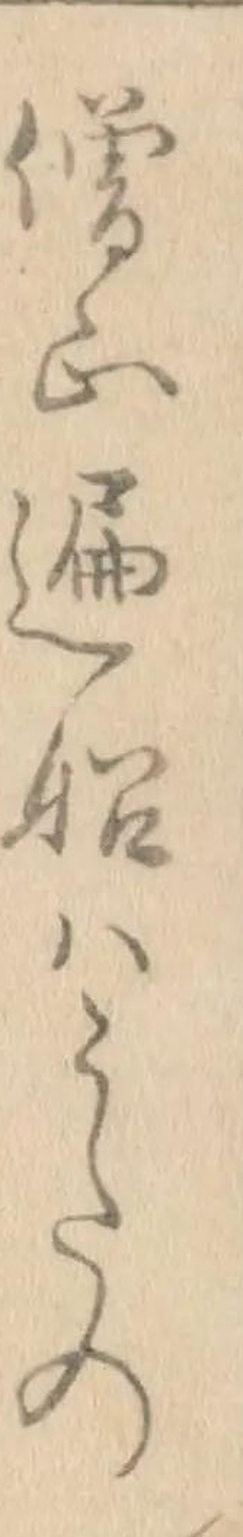僧正遍昭はうたの
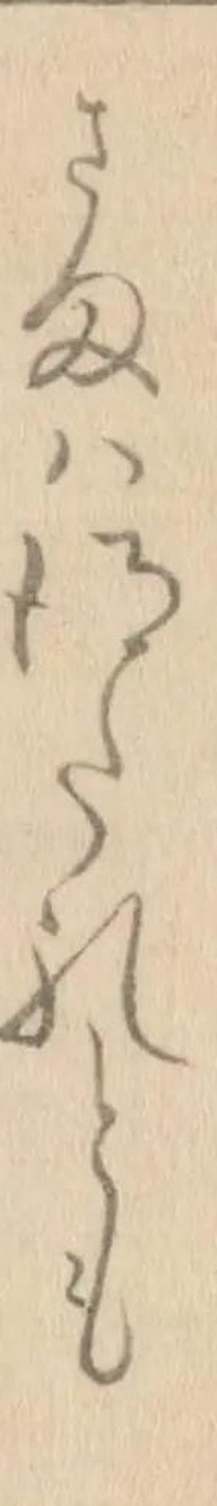さまは得たれとも
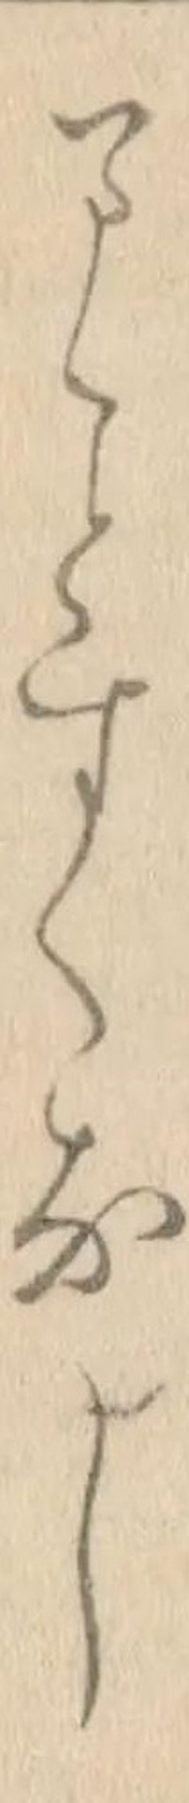まことすくなし
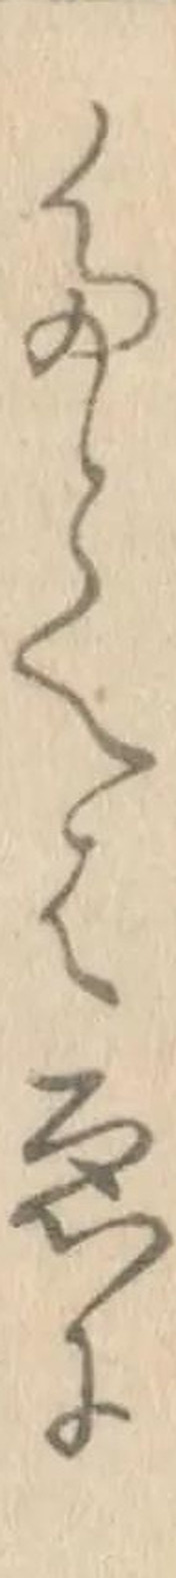たとへはゑに
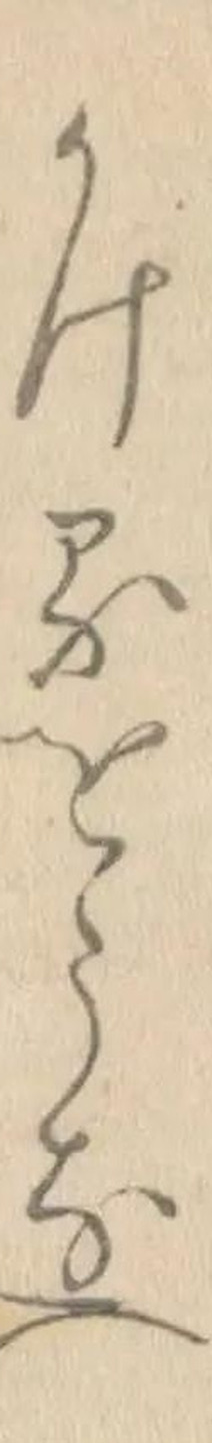かけるをうな
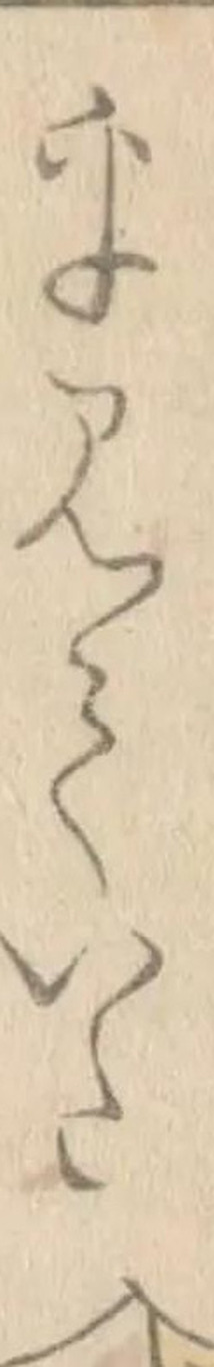を見ていた
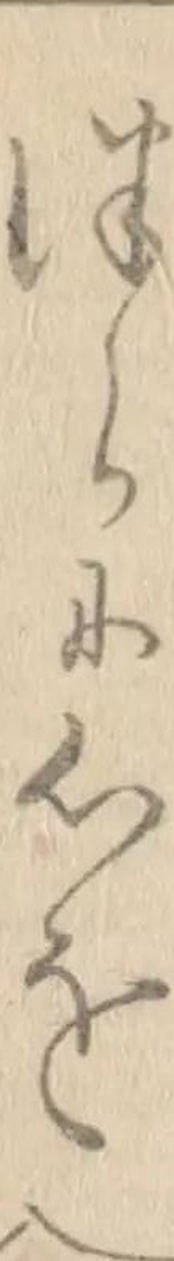つらに心を
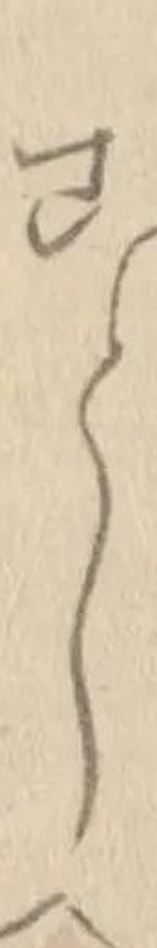ことし
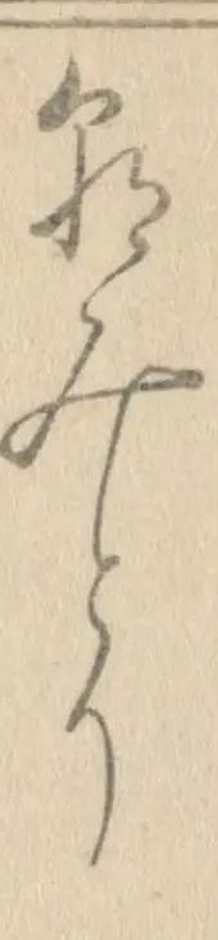朝みとり
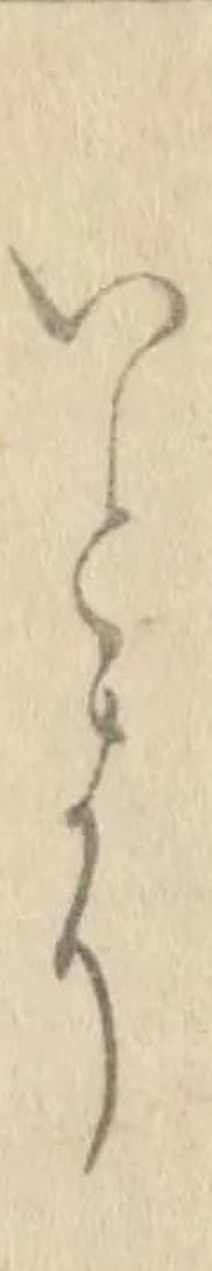いとより
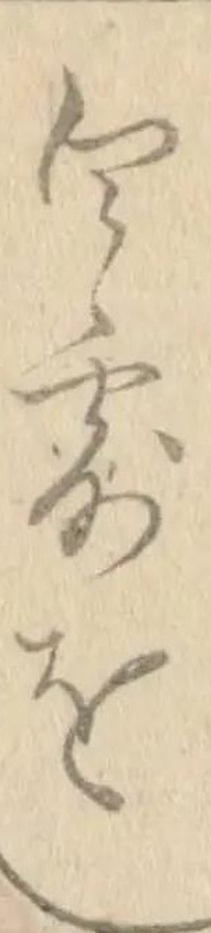白露を
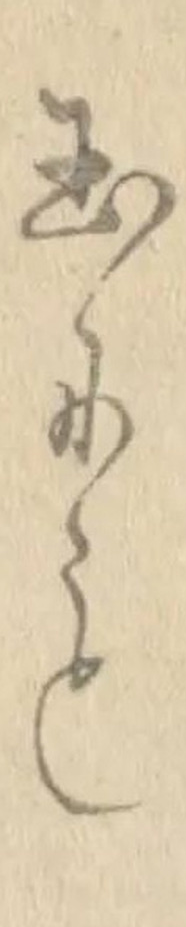玉にも
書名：錦百人一首あつま織
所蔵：国立国会図書館 National Diet Library, JAPAN
